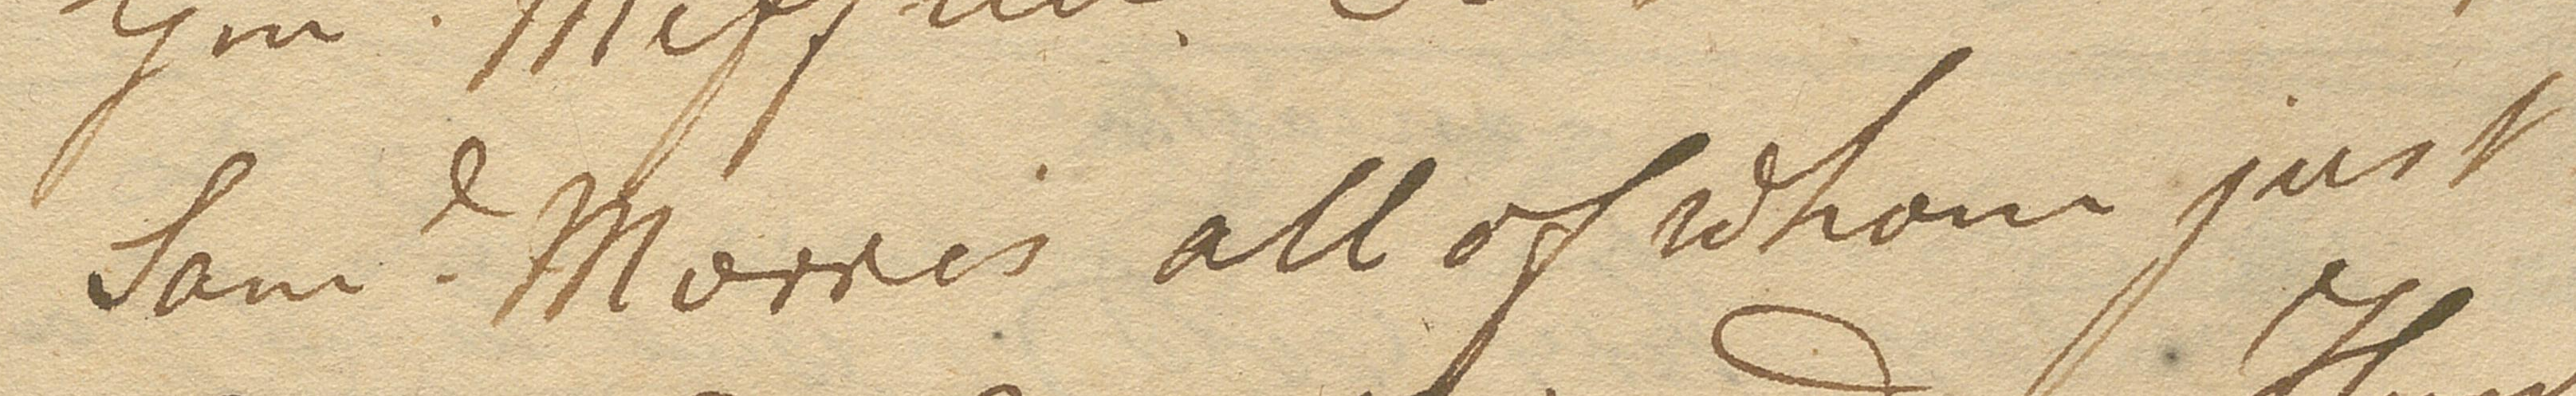Sam^l. Morris all of whom just
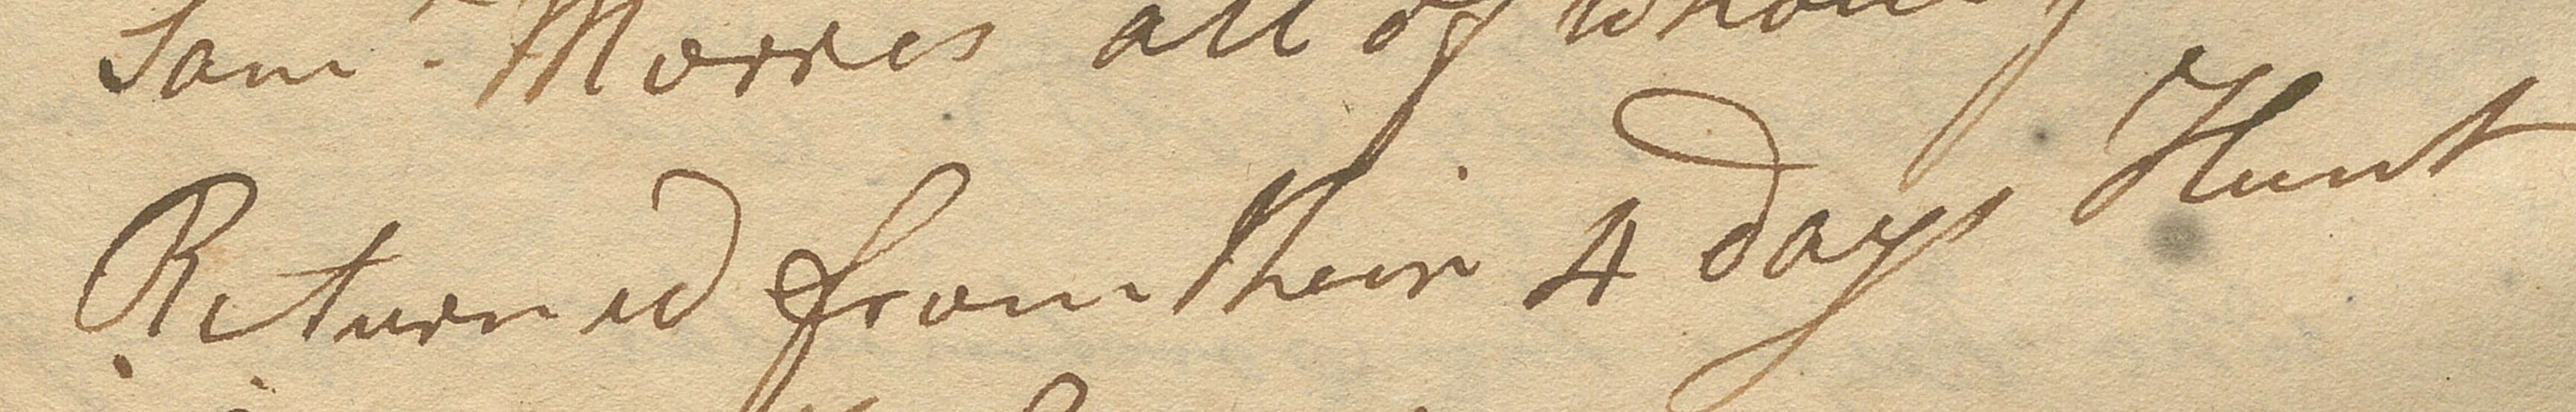Returned from them 4 days Hunt
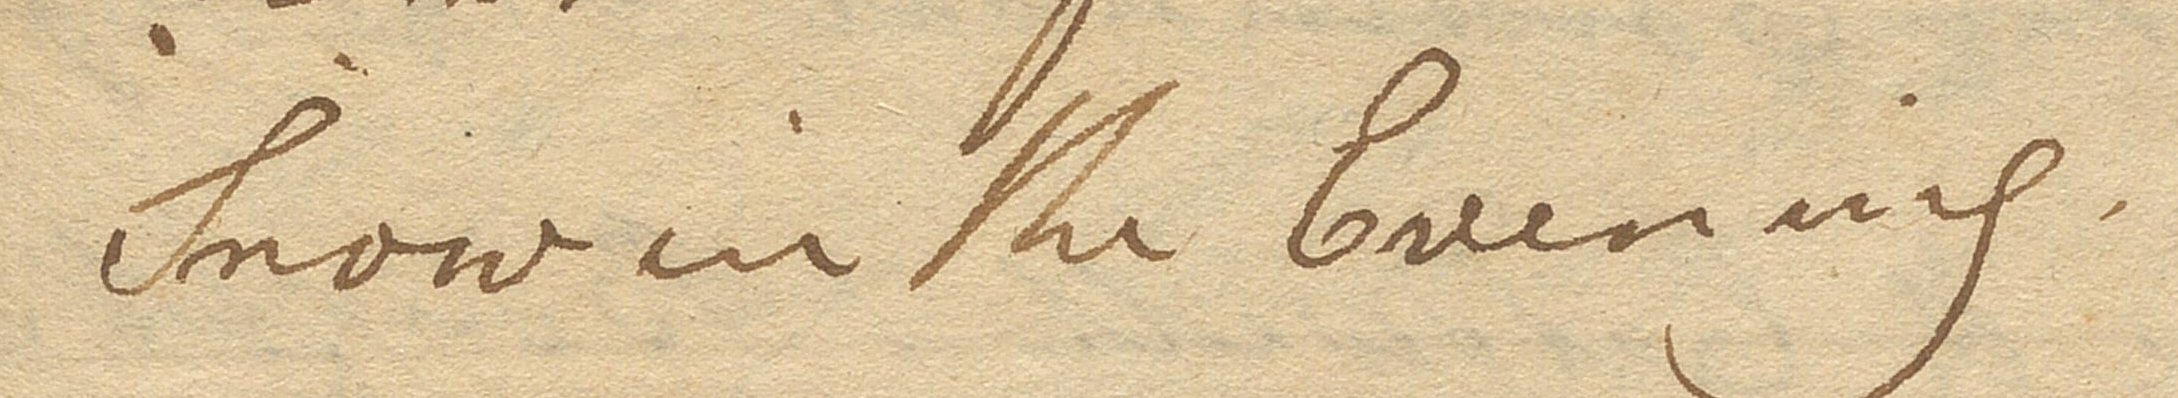Snow in the Evening
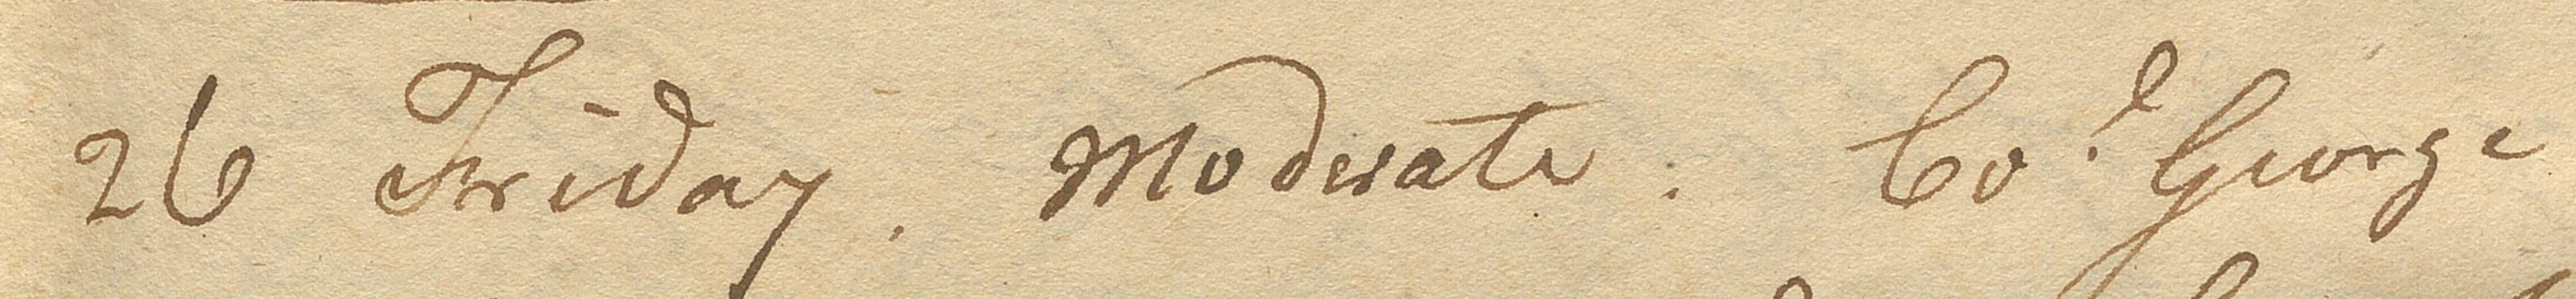26 Friday Moderate. Co^l. George
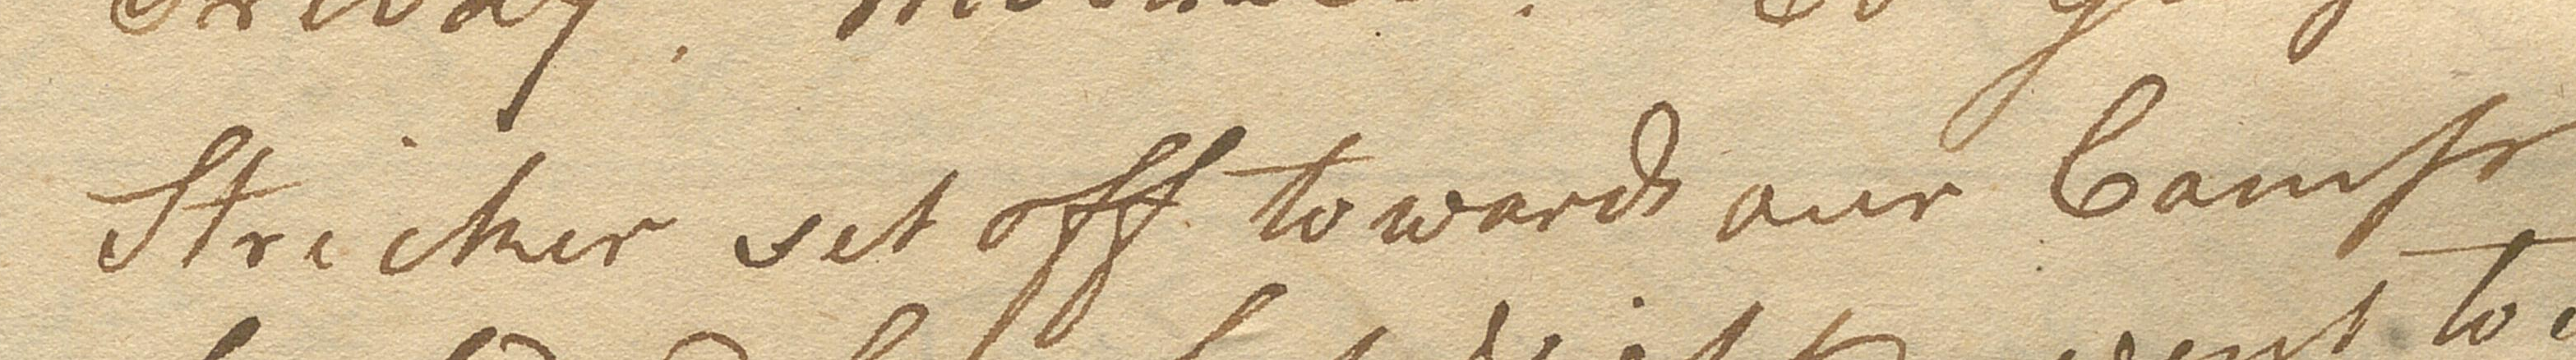Stricker set off towards our Camps
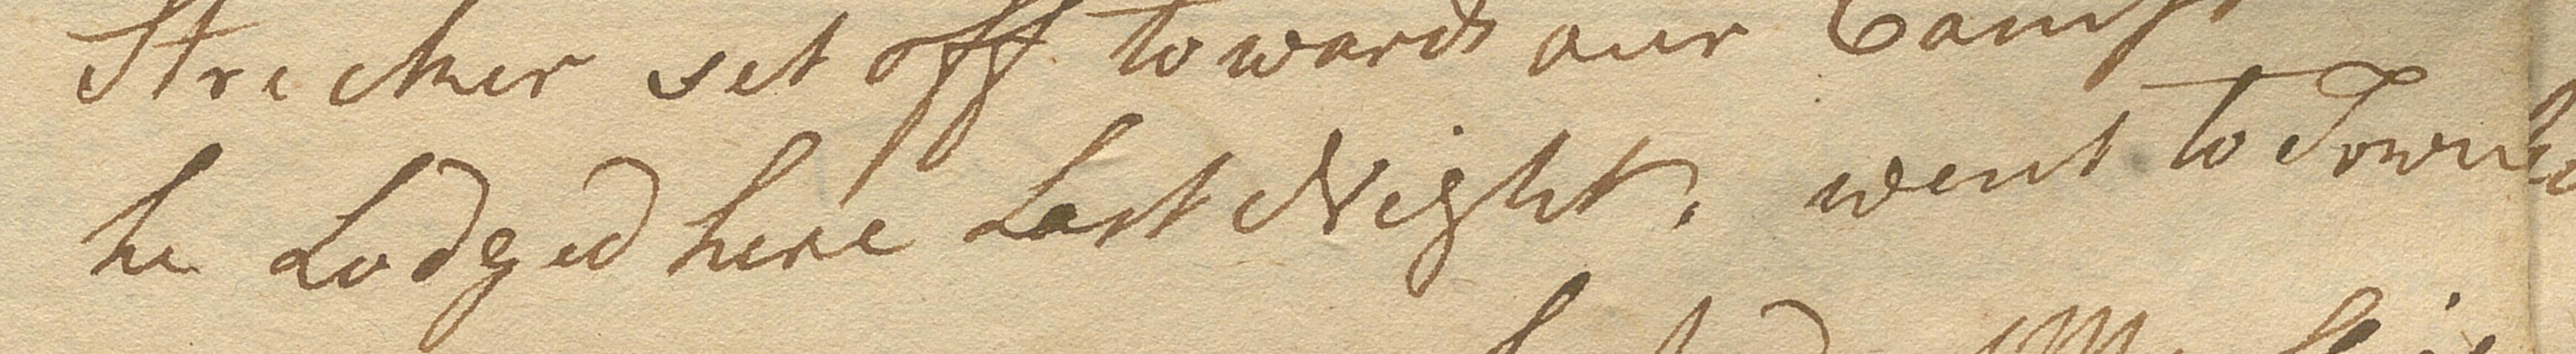he Lodged here Last Night, went to Town
